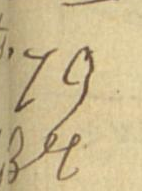-79
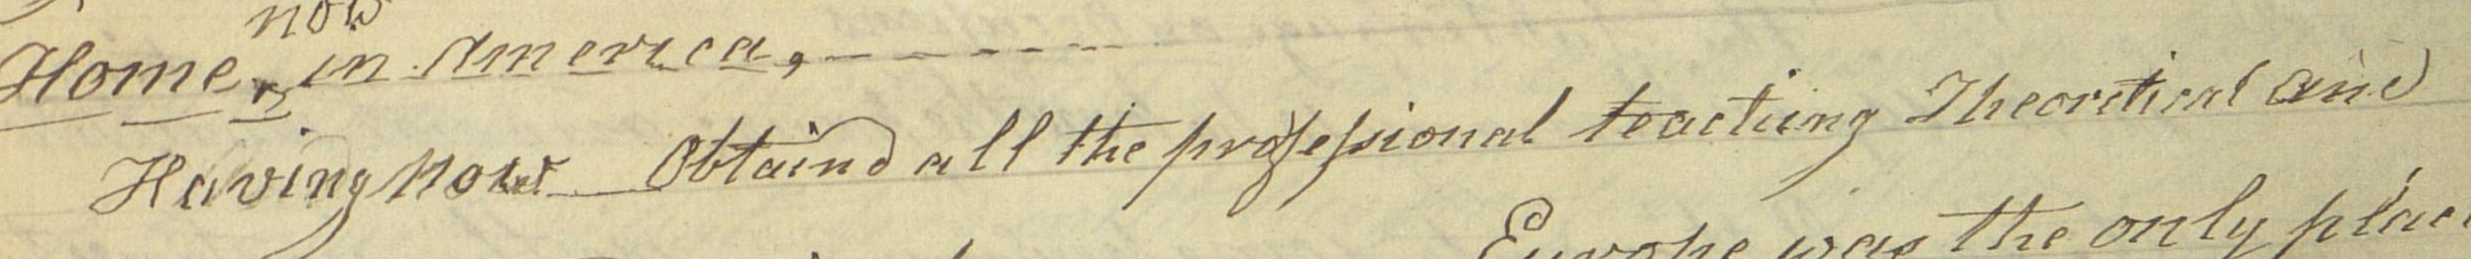Having now Obtained all the professional teacting Theoretical and
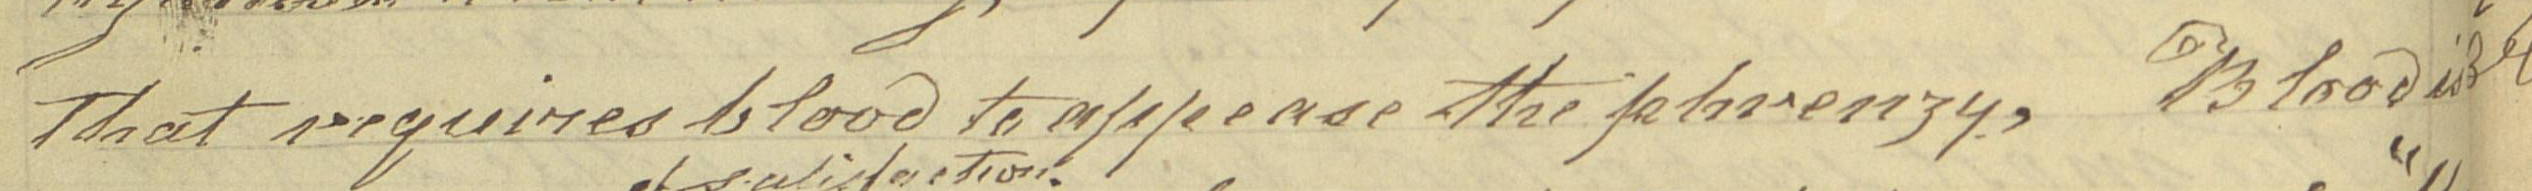that requires blood to appease the phrenzy, Blood is
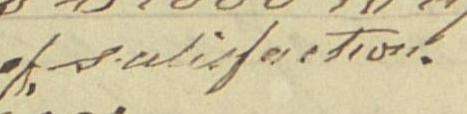of satisfaction.
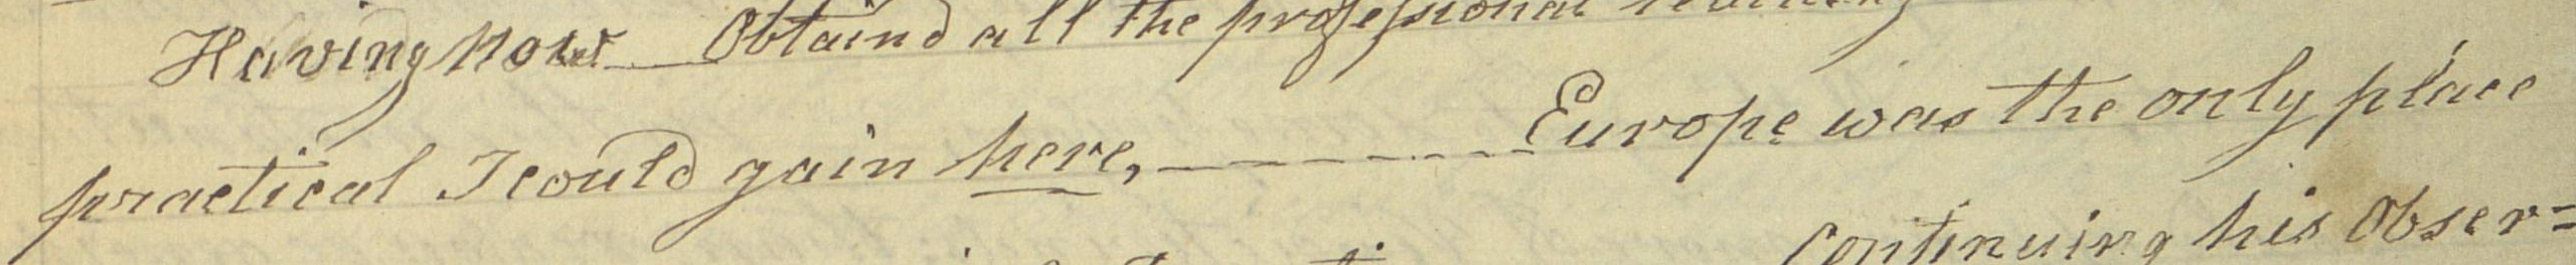practical I could gain here, Europe was the only place
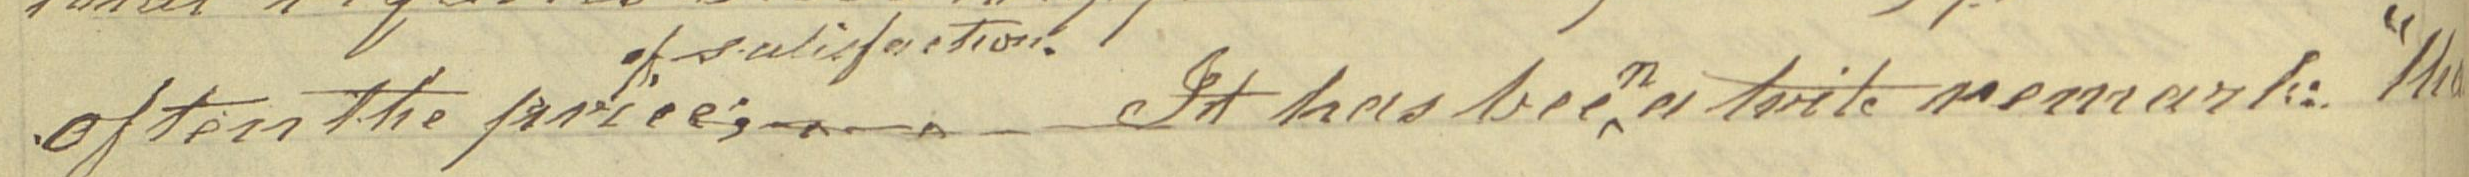often the price; ^ ^ It has been a trite remark: "H-
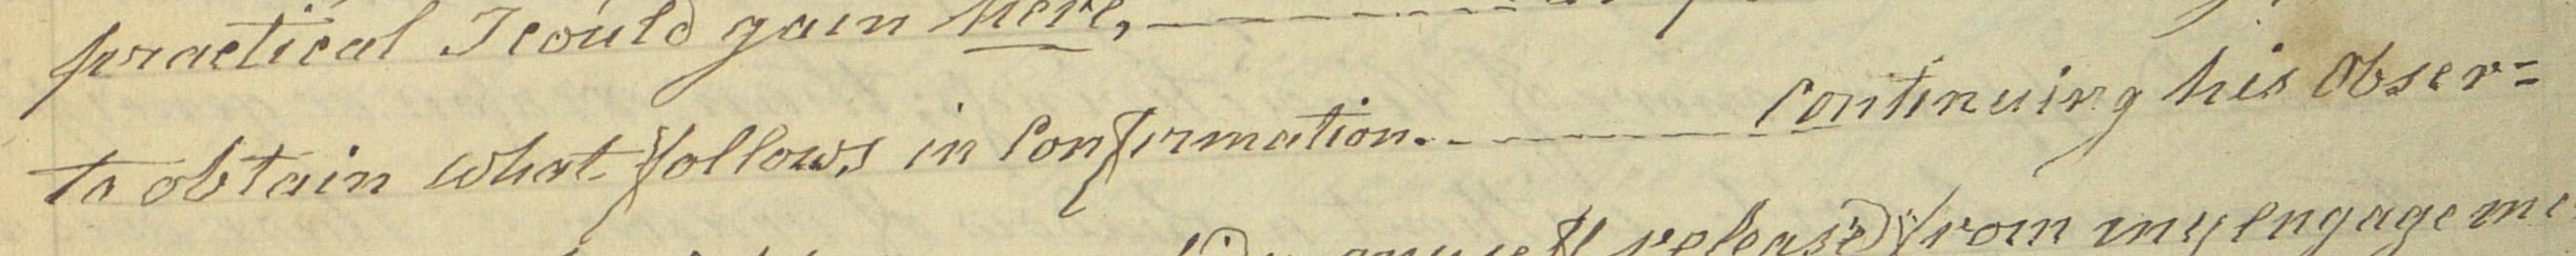to obtain what follows in confirmation. Continuing his obser-
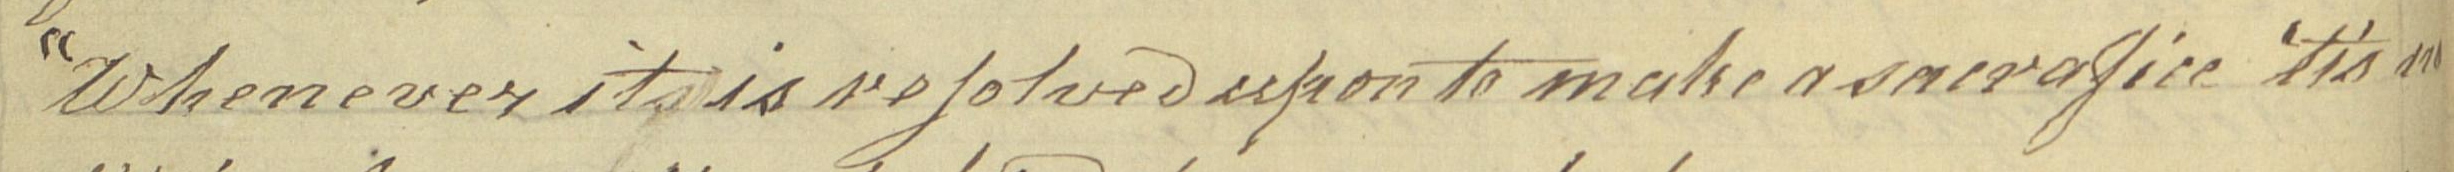"Whenever it is resolved upon to make a sacrafice 'tis n-
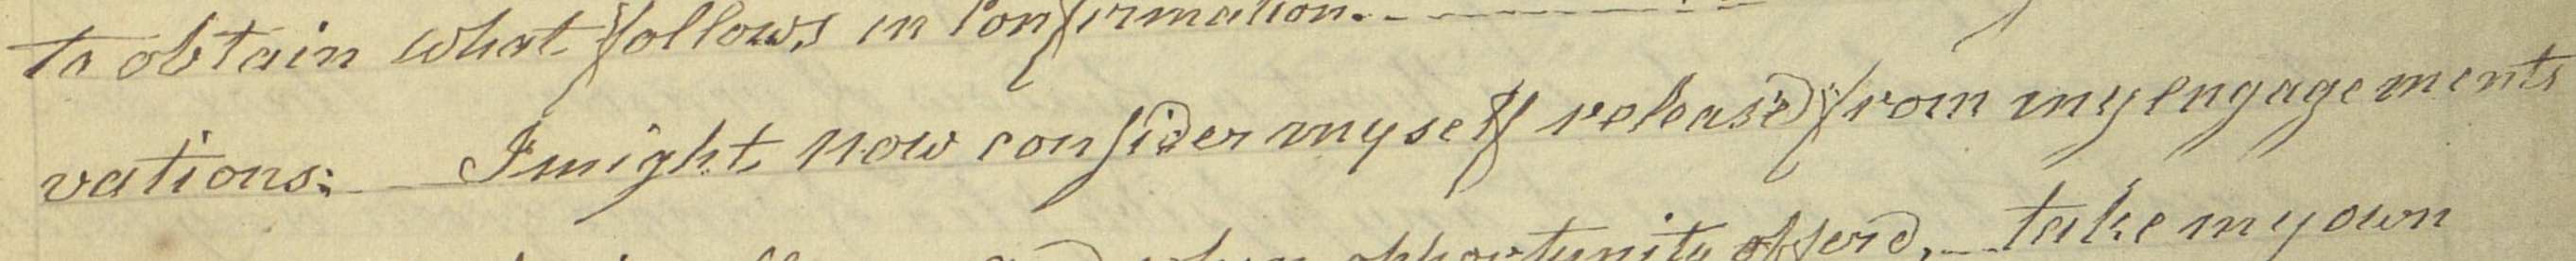-vations. I might now consider myself releasd from my engagements
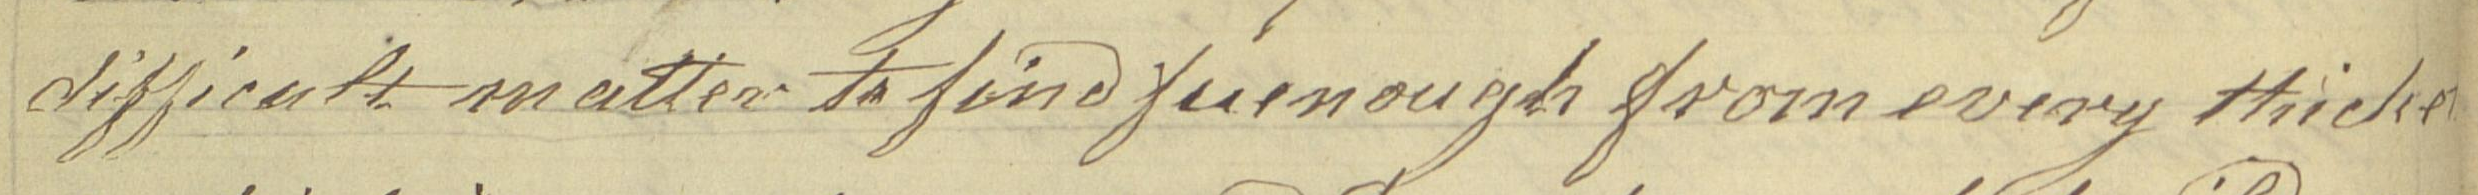difficult matter to find fee enough from every thicket
